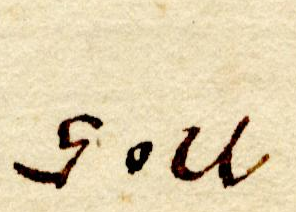No 5
